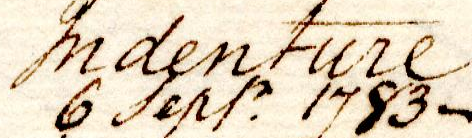Ma denl^y. 172
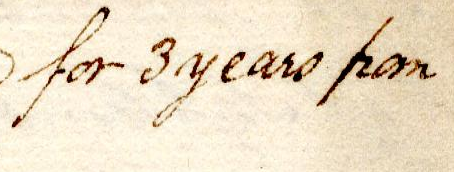for 3 years from
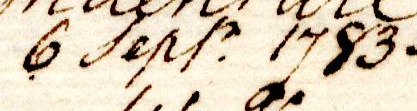6 Sept^r. 1783.
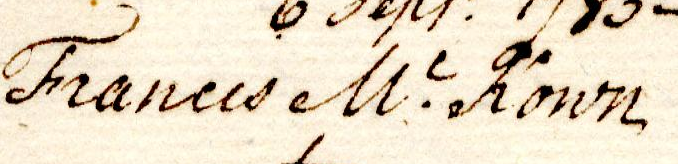Frances M^c.Kown
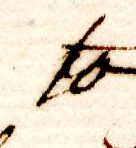to
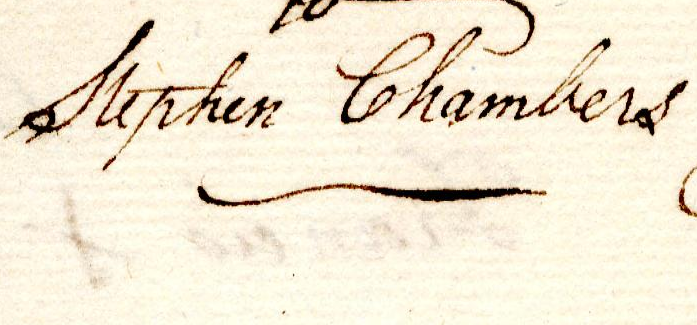Stephen Chambers
